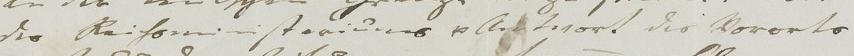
des Reichsministeriums & Antwort des Vororts
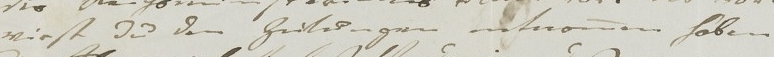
wirst Du den Zeitungen entnommen haben.
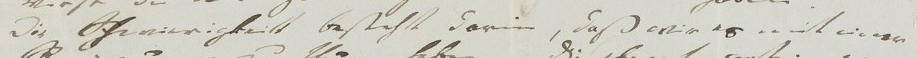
Die Schwierigkeit besteht darin, daß wir es mit einer
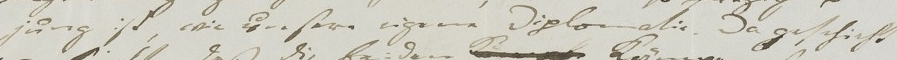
jung ist, wie unsere eigene Diplomatie. Da geschieht
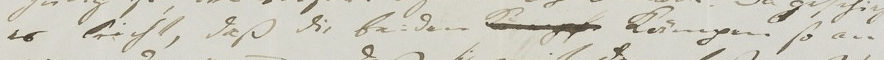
es leicht, daß die beiden Kämpf Kämpen so an
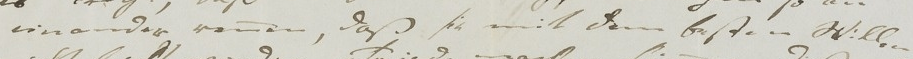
einander rennen, daß sie mit dem besten Willen
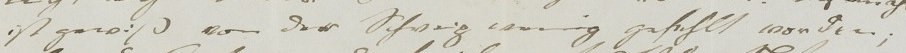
ist gewiß von der Schweiz wenig gefehlt worden;
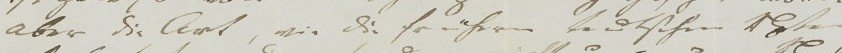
aber die Art, wie die frühern teutschen Noten
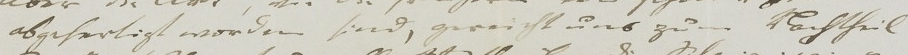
abgefertigt worden sind, gereicht uns zum Nachtheil.
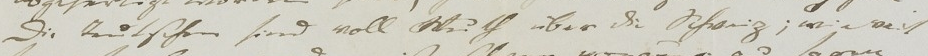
Die Teutschen sind voll Wuth über die Schweiz; wie weit
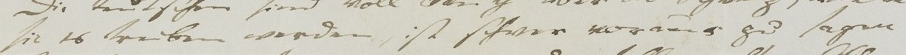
sie es treiben werden, ist schwer voraus zu sagen.
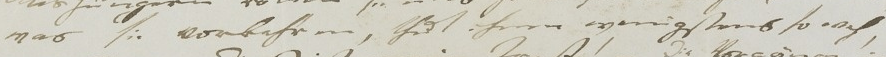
was sie vorkehren, thut ihnen wenigstens so weh,
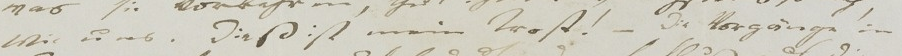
wie uns. Dieß ist mein Trost! – Die Vorgänge in
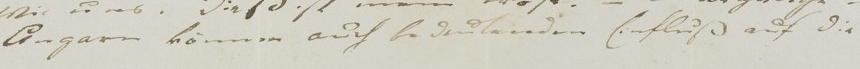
Ungarn können auch bedeutenden Einfluß auf die
